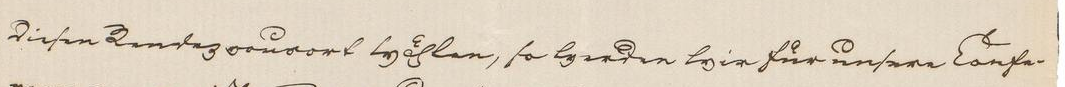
diesen Rendezvousort wählen, so werden wir für unsere Confe-
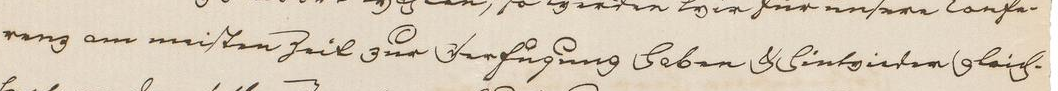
renz am meisten Zeit zur Verfügung haben & hinwieder gleich-
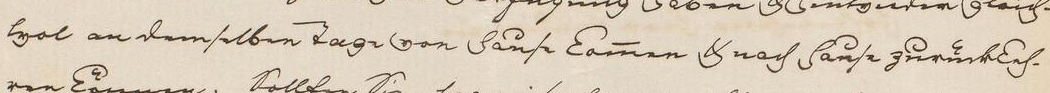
wol an demselben Tage von Hause kommen & nach Hause zurückkeh-
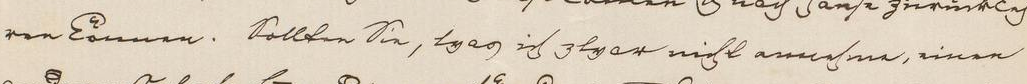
ren können. Sollten Sie, was ich zwar nicht annehme, einen
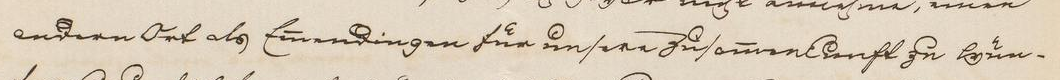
andern Ort als Emmendingen für unsere Zusammenkunft zu wün-
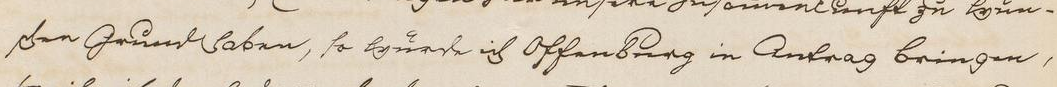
schen Grund haben, so würde ich Offenburg in Antrag bringen,
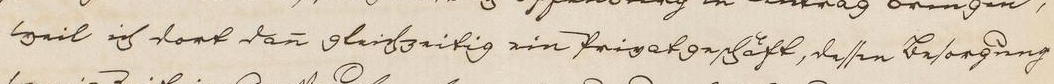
weil ich dort dann gleichzeitig ein Privatgeschäft, dessen Besorgung
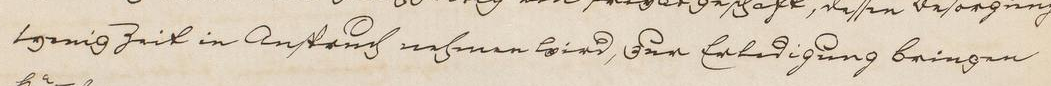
wenig Zeit in Anspruch nehmen wird, zur Erledigung bringen
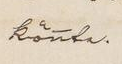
könnte.
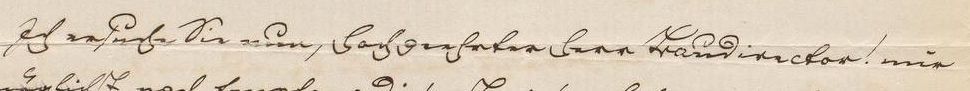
Ich ersuche Sie nun, hochgeehrter Herr Baudirector! mir
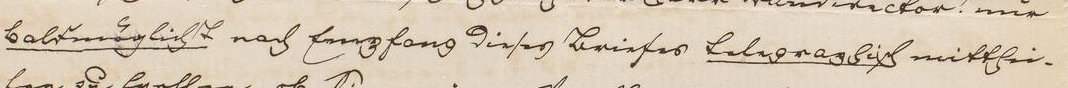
baldmöglichst nach Empfang dieses Briefes telegraphisch mitthei-
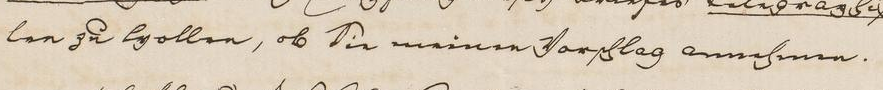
len zu wollen, ob Sie meinen Vorschlag annehmen.
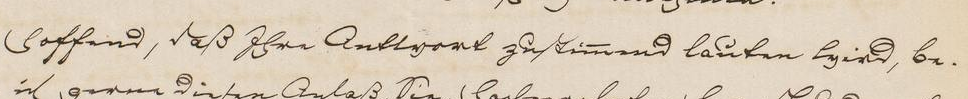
Hoffend, daß Ihre Antwort zustimmend lauten wird, be-
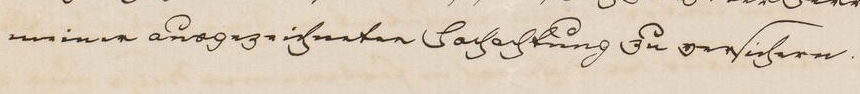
meiner ausgezeichneten Hochachtung zu versichern.
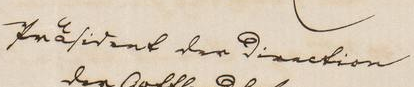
Präsident der Direction
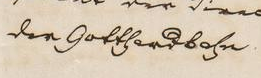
der Gotthardbahn.
